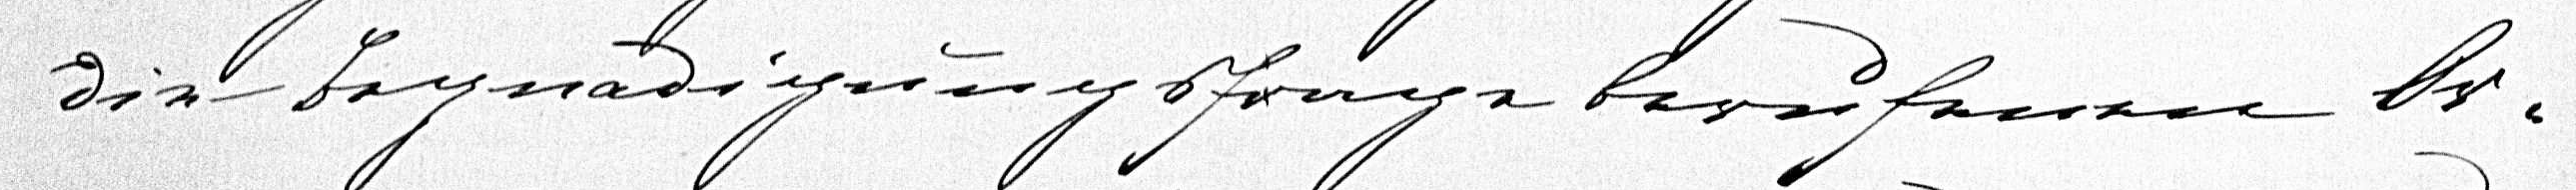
die Begnadigungsfrage berufenen Or¬
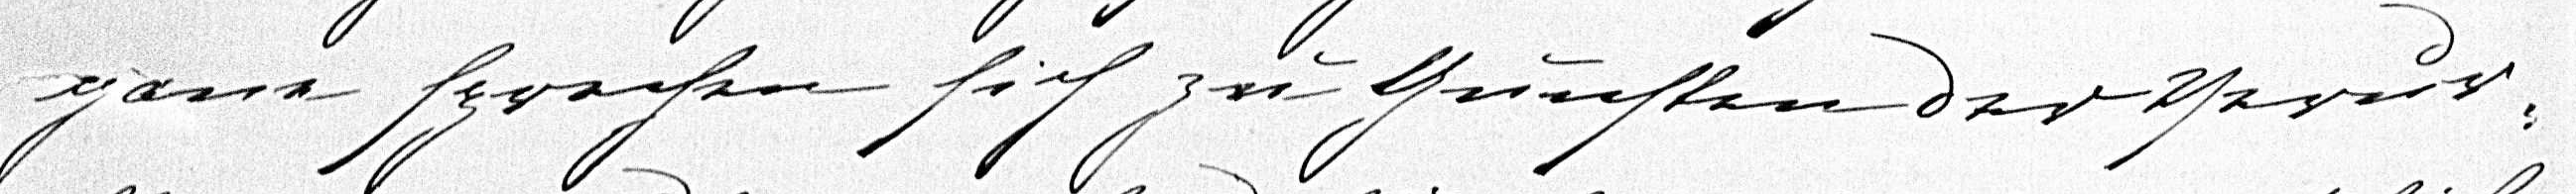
gane sprachen sich zu Gunsten der Verur¬
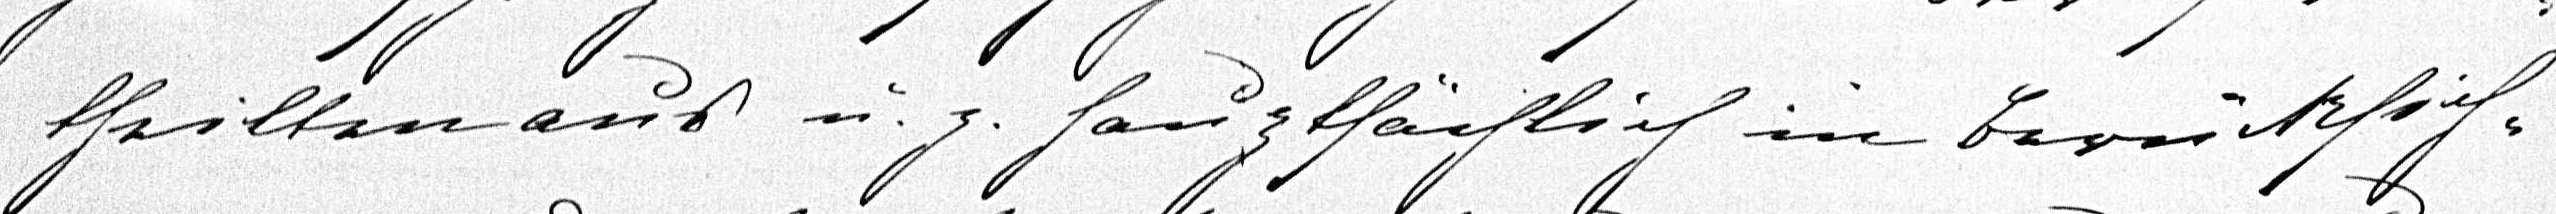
theilten aus u.z. hauptsächlich in Berücksich¬
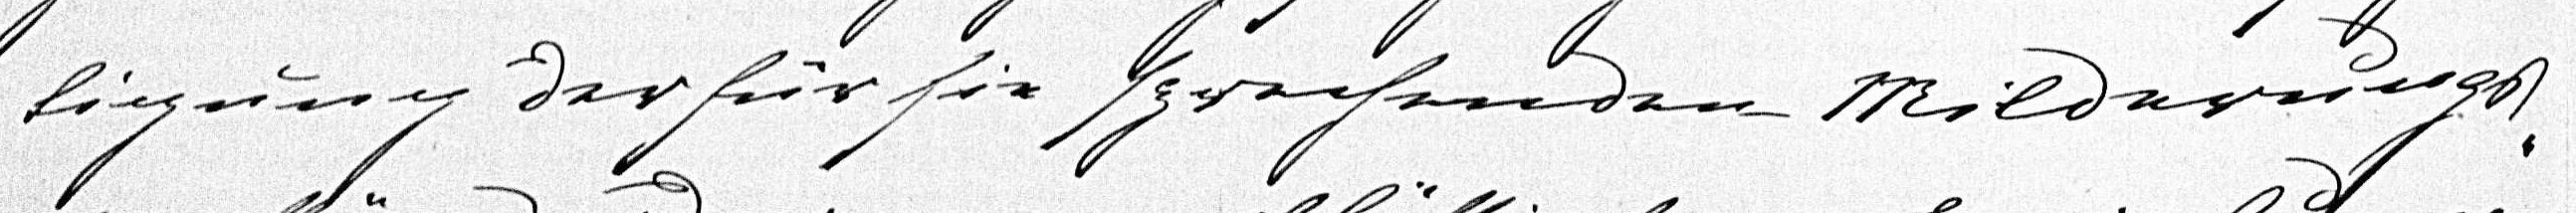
tigung der für sie sprechenden Milderungs¬
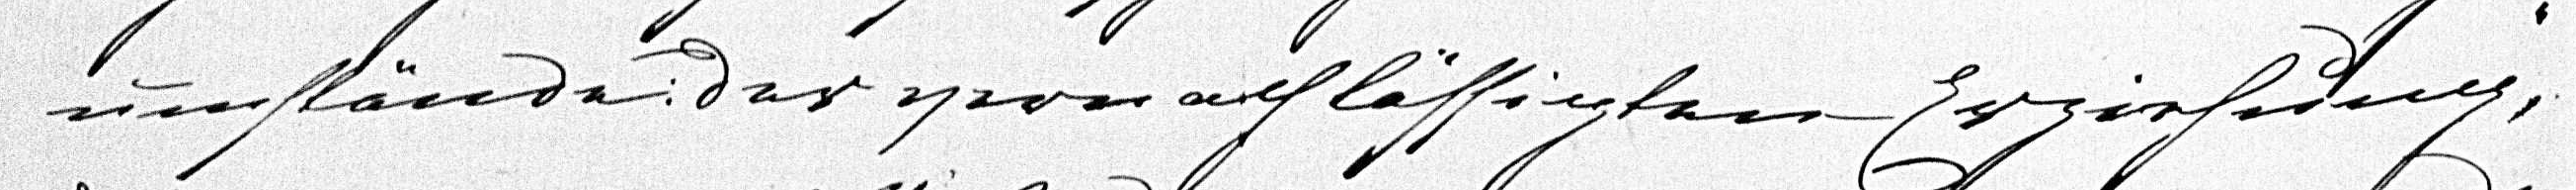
umstände: der vernachlässigten Erziehung,
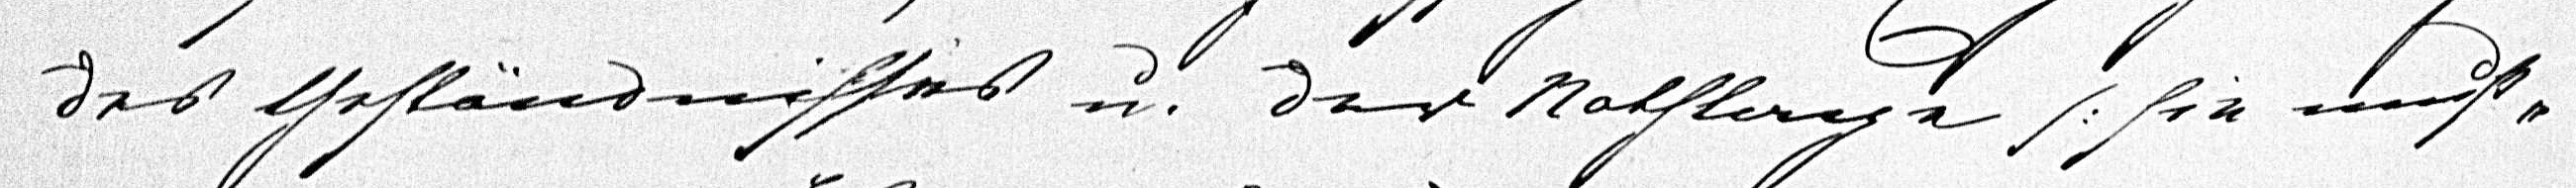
des Geständnisses u. der Nothlage (sie muß¬
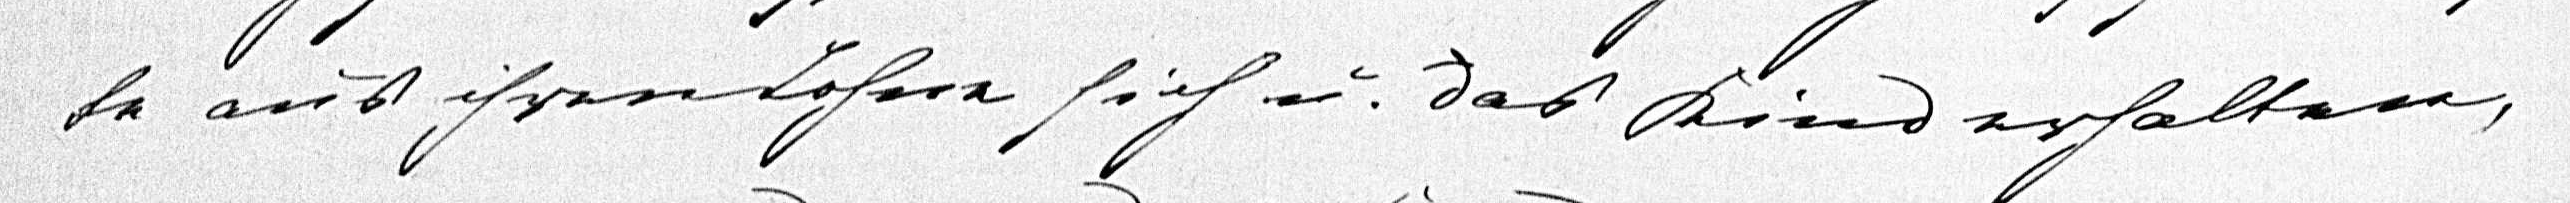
te aus ihren Lohne sich u das Kind erhalten,
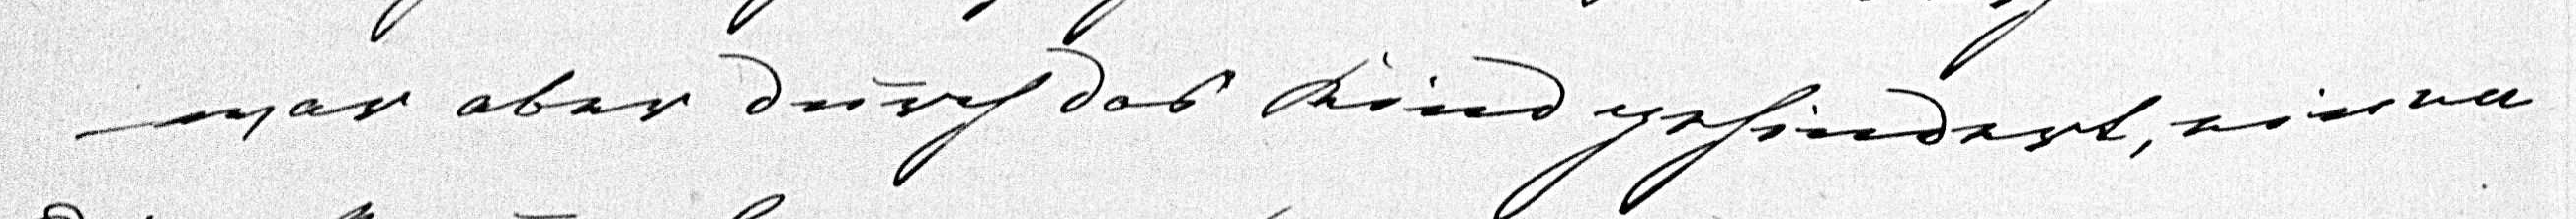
war aber durch das Kind gehindert, einen
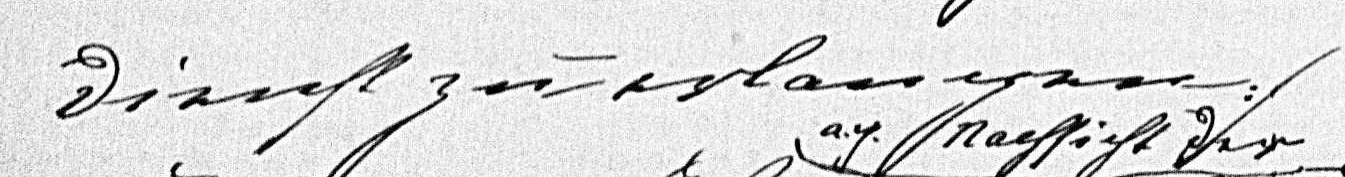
Dienst zu erlangen).
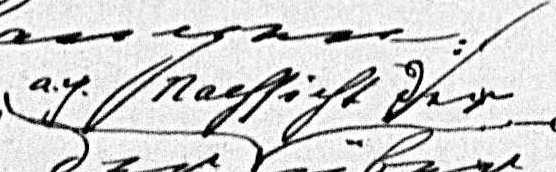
a.g. Nachsicht der
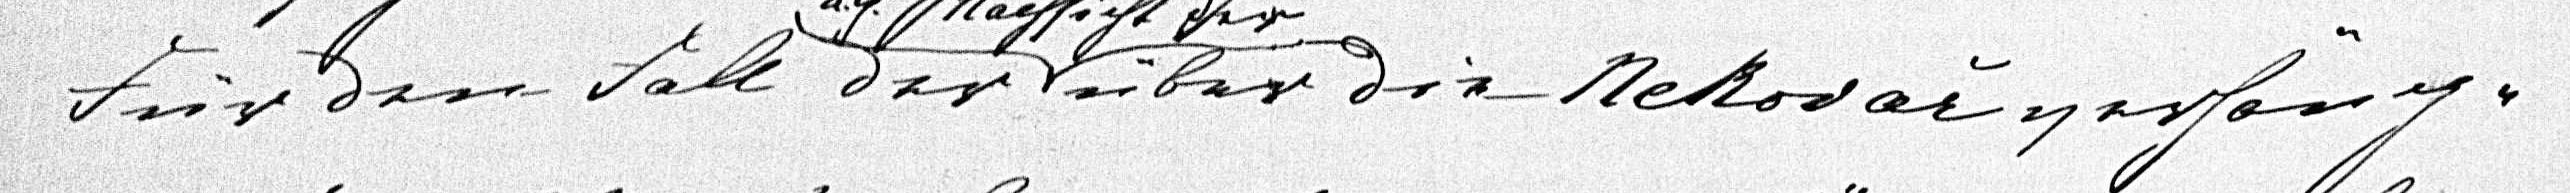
Für den Fall der über die Nekovař verhäng¬
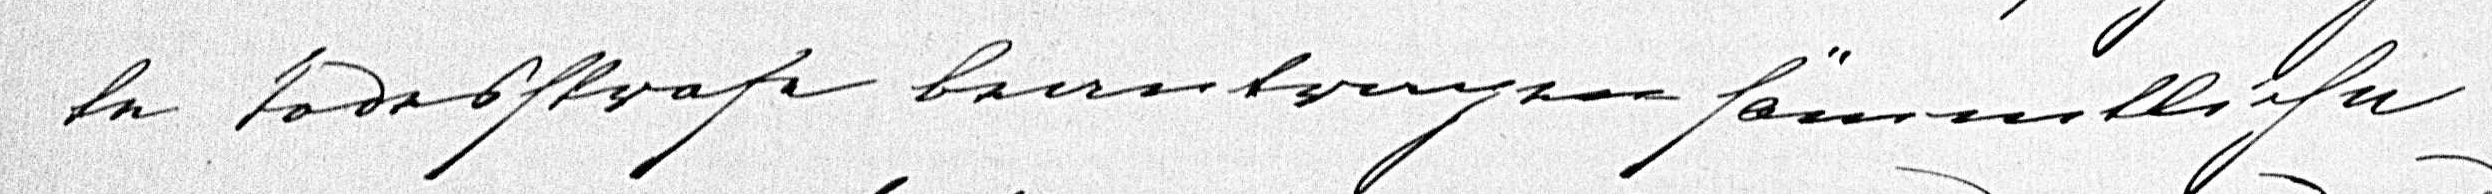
te Todesstrafe beantragen sämmtliche
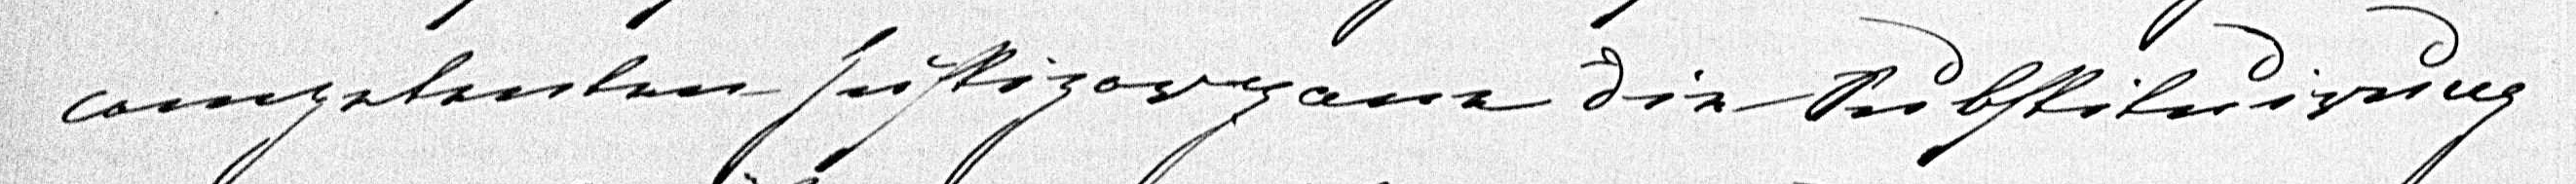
competenten Justizorgane die Substituirung
